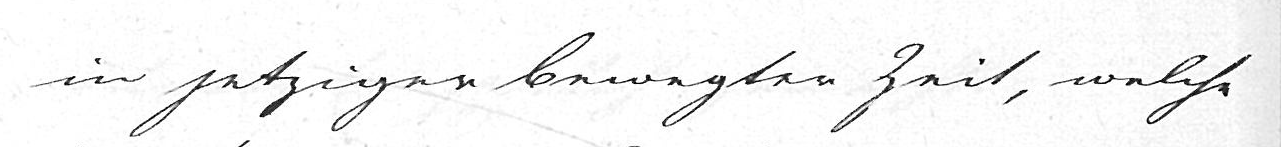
in jetziger bewegter Zeit, welche
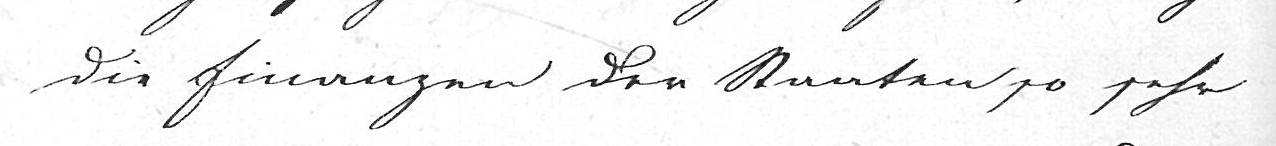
die Finanzen der Staaten so sehr
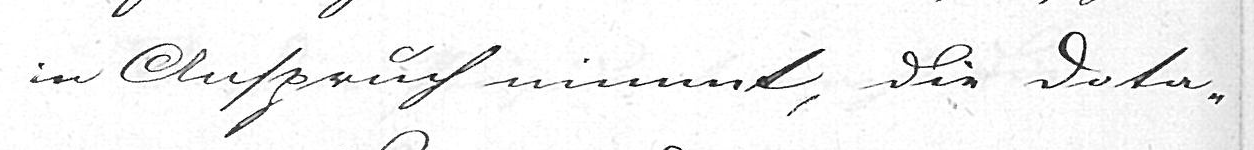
in Anspruch nimmt, die Dota-
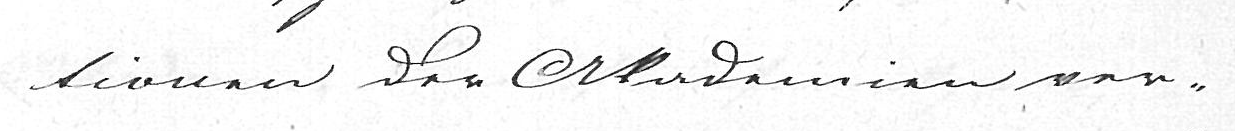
tionen der Akademien ver-
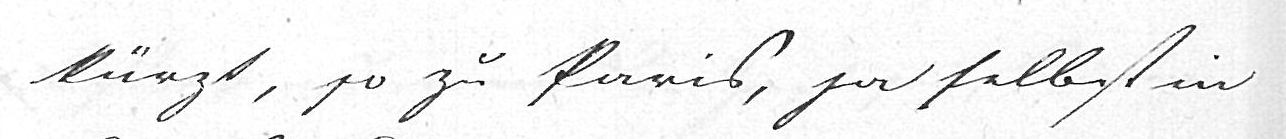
kürzt, so zu Paris, ja selbst in
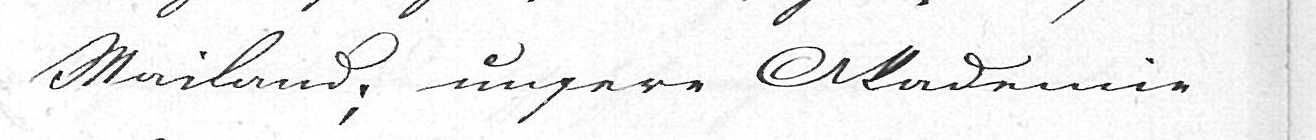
Mailand; unsere Akademie
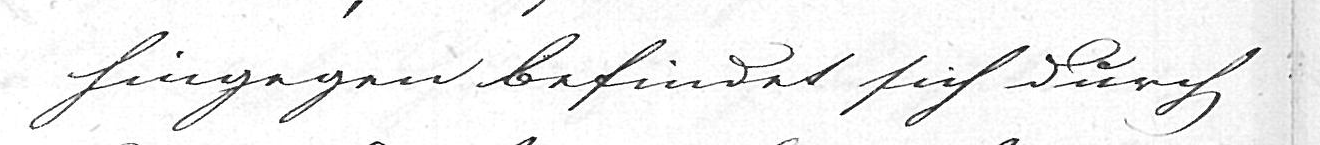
hingegen befindet sich durch
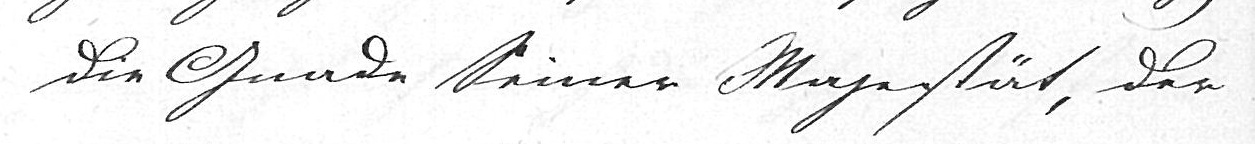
die Gnade Seiner Majestät, der
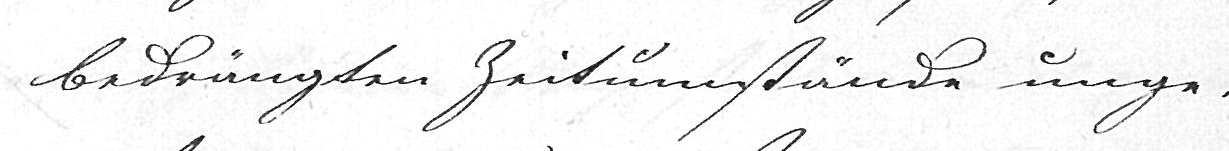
bedrängten Zeitumstände unge-
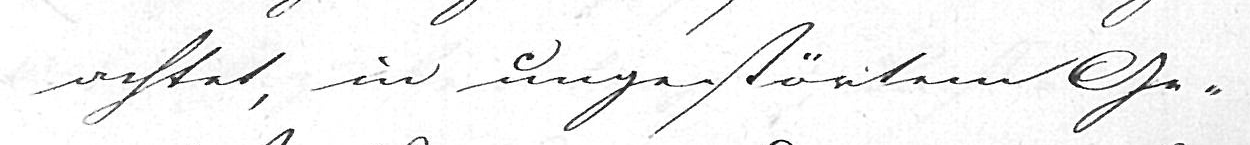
achtet, in ungestörtem Ge-
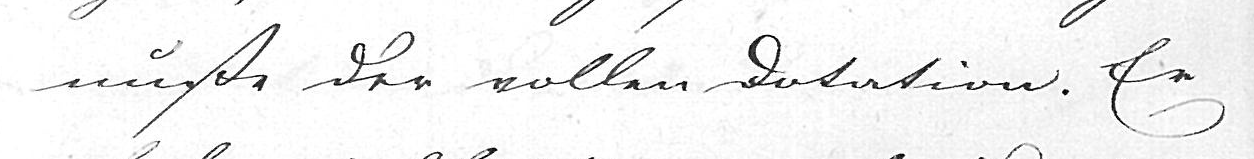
nuße der vollen Dotation. Er
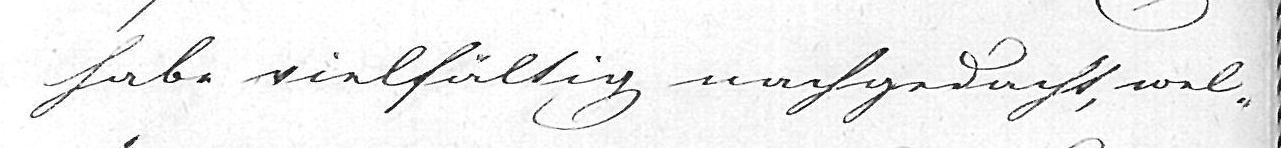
habe vielfältig nachgedacht, wel-
